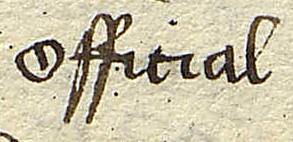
Official
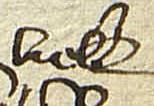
lieb*
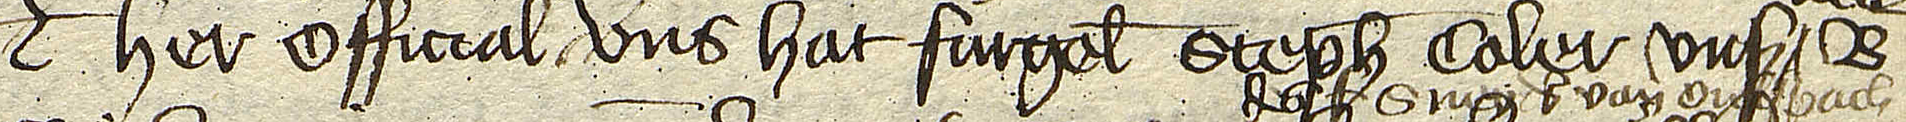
L* her Official / vns hat fürgel* Steph* Coler vnſ* B*
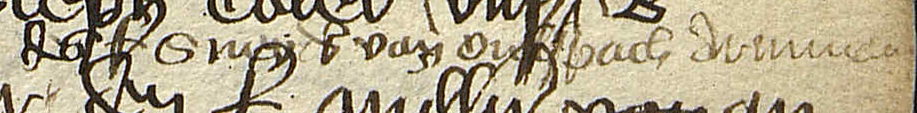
des f Sneyds* von Onlſpach Armman
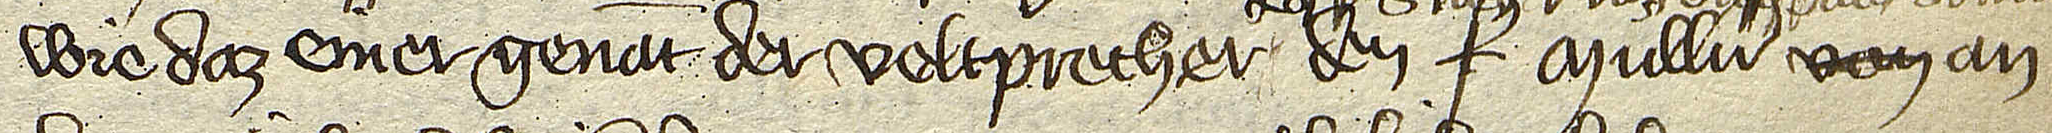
wie daʒ einer genat* der veltprecher den f Mülln* von an
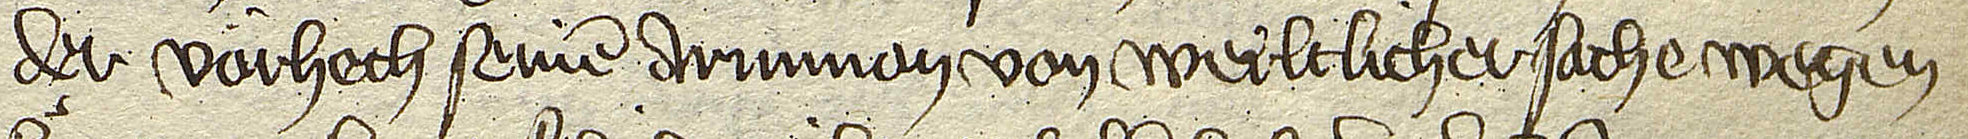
der vörhech ſeine* Armman von werltlicher ſache wegen
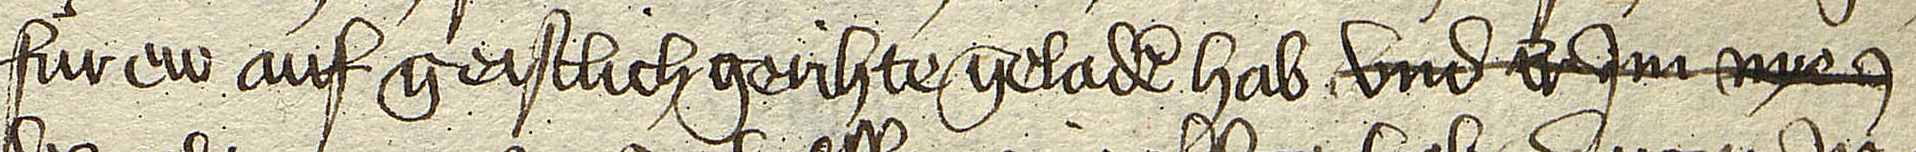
für ew auf geiſtlich gerihte gelade* hab vnd Er Im nye I
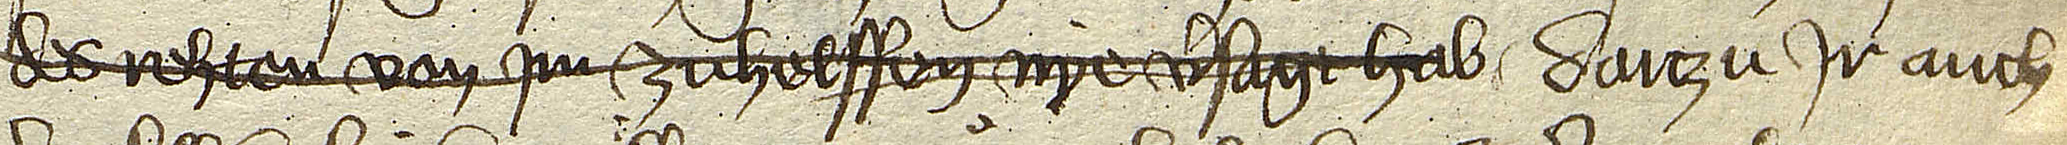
des rehten von Im cʒuhelffen nye v*ſagt hab / darcʒu Ir auch
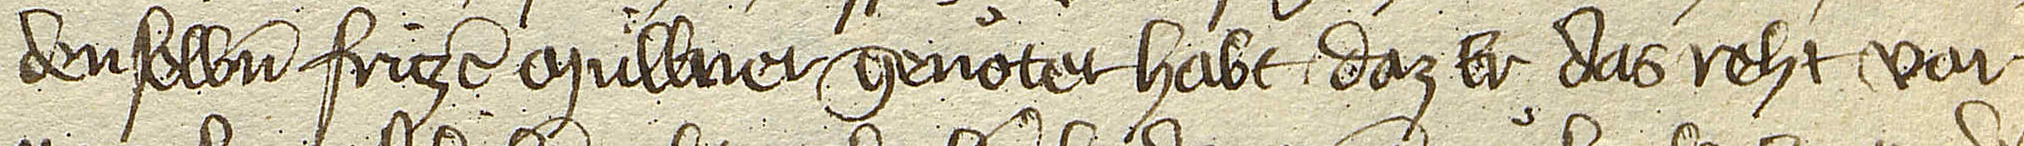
denſelbn* fricʒe* Müllner genötet habt / daʒ er das reht vor
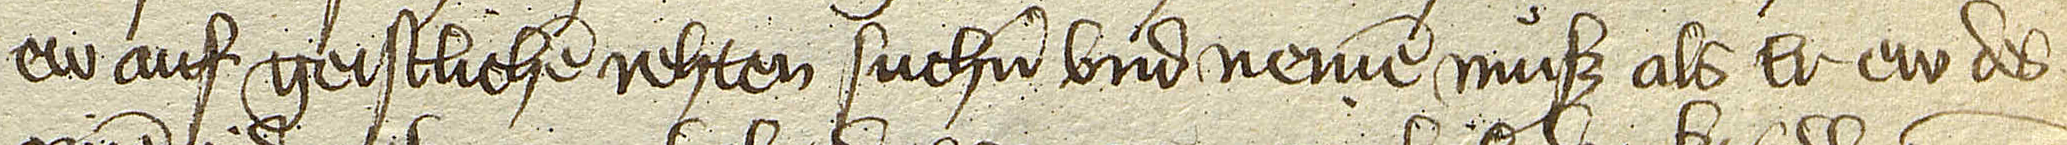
ew auf geiſtliche* rehten ſuchn* vnd neme* müſʒ als Er ew des
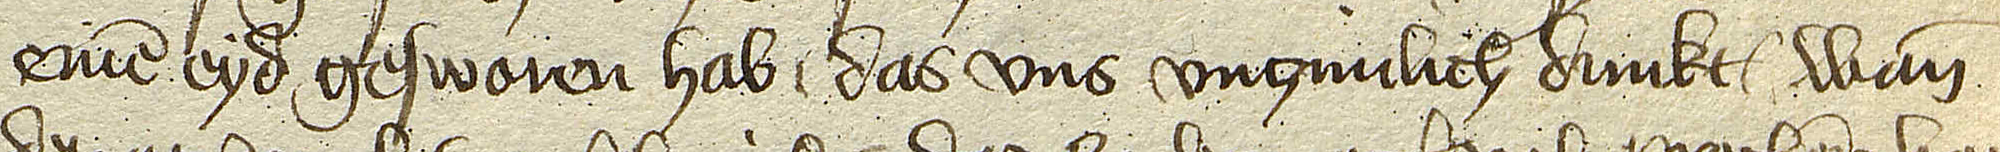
eine* eyd geſworen hab / das vns vncʒimlich dunkt / wan*
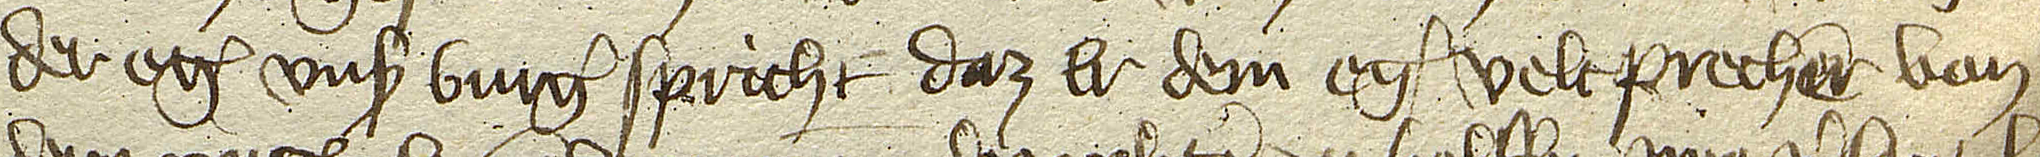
der eg* vnſ* burg* ſpricht daʒ Er dem eg* veltprecher von
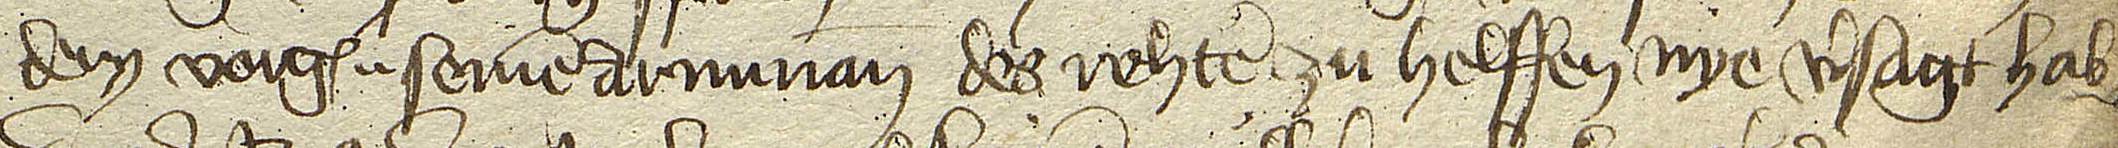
dem vorg* ~ ſeine* Armman* des rehte* cʒu helffen nye v*ſagt hab
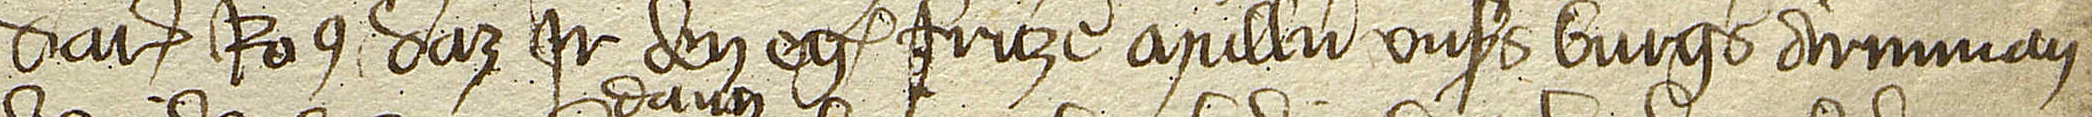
dar* Ro* / daʒ Ir den eg* fricʒe* Mülln* vnſ*s burgs* Armman
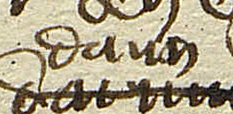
da%%%
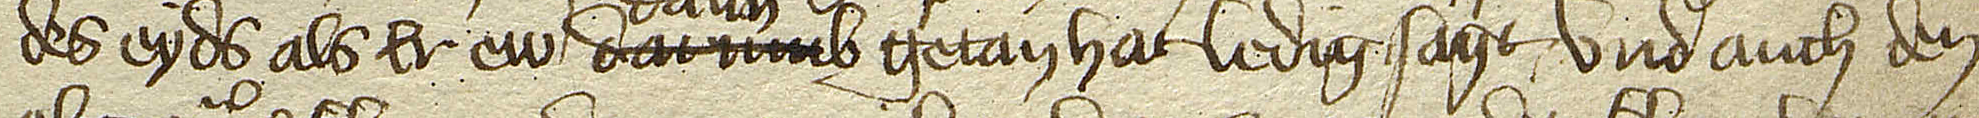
des eyds als Er ew darumb getan hat ledig ſagt / vnd auch den
